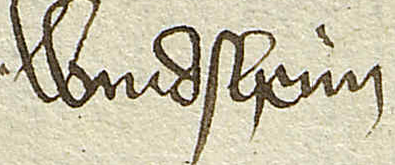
Windſheim
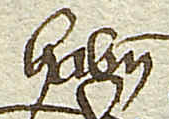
habn*
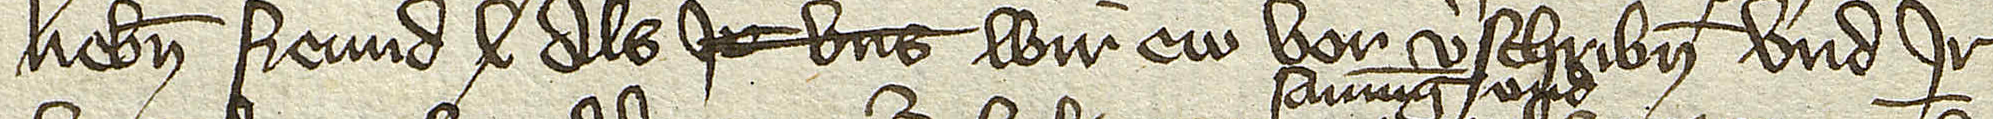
Liebn* freund l Als Ir vns wir ew vor v*ſchribn* vnd Ir
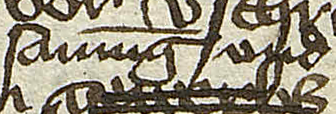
ſamu*g vnd
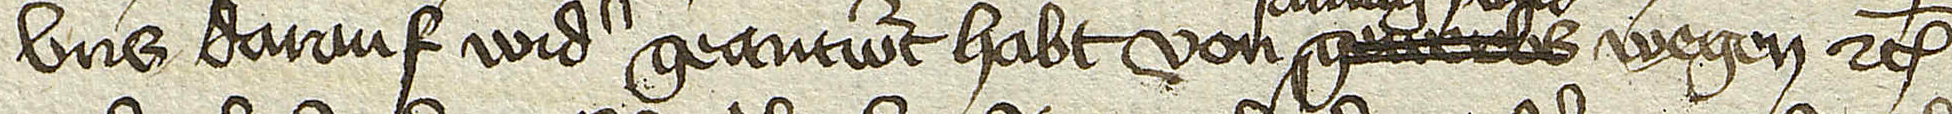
vns darauf wid* geantwt* habt von gewerbs wegen ec*
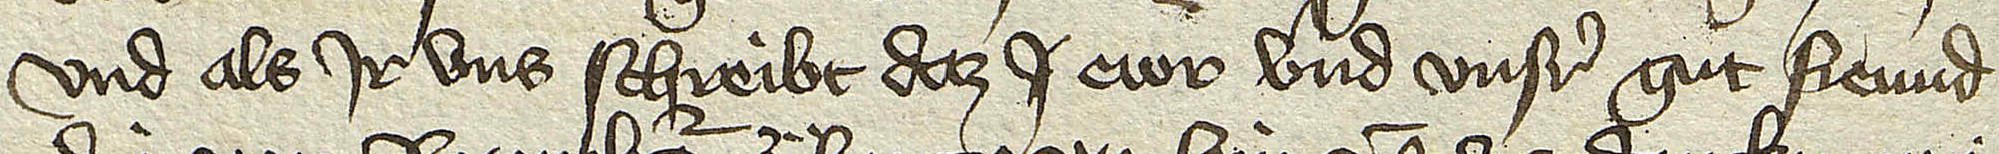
vnd als Ir vns ſchreibt daʒ I ewr vnd vnſr* gut freund
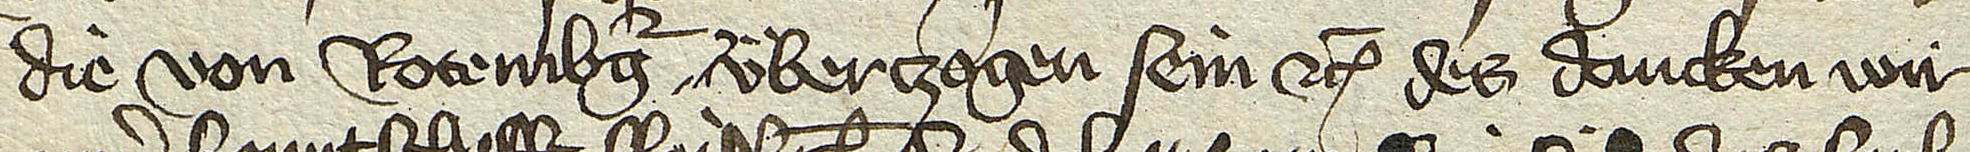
die von Rotemb*g / v̈bercʒogen ſein ec* des dancken wir
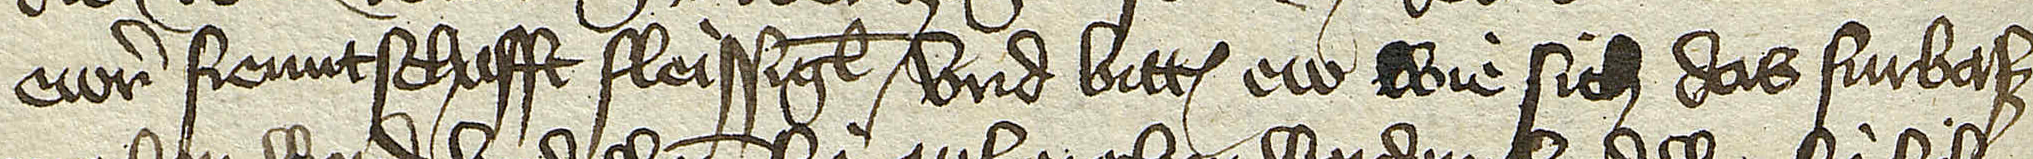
ewr* freuntſchafft fleiſſigl* / vnd bitt* ew wie ſich das furbaſʒ
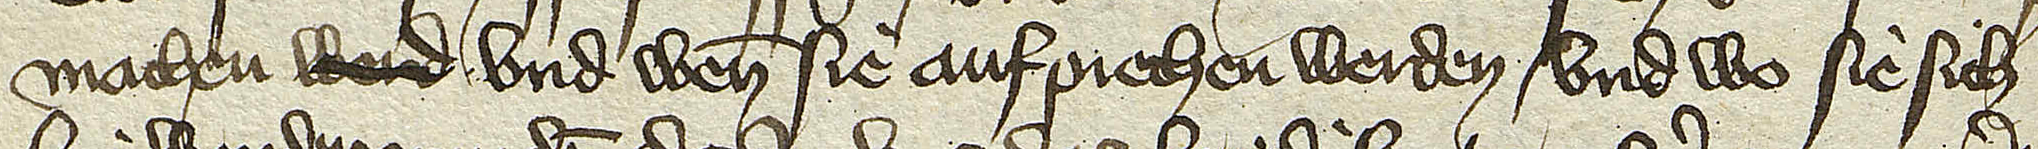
machen werd vnd wen* ſie aufprechen werden / vnd wo ſie ſich
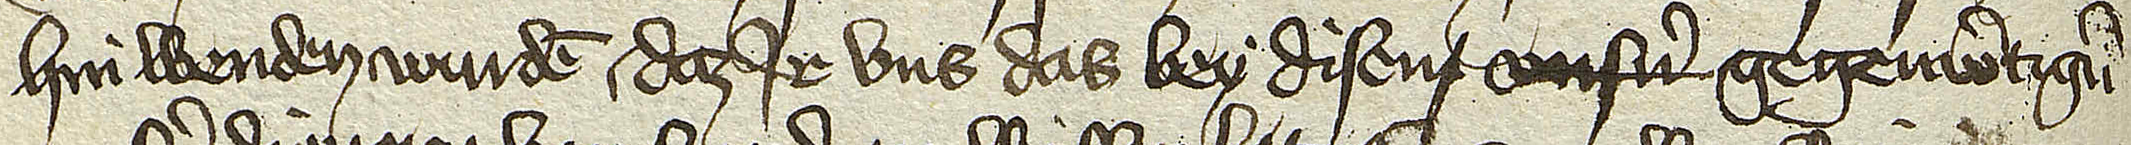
hin wenden wurde* / daʒ Ir vns das bey diſen vnſn* gegenw*tign*
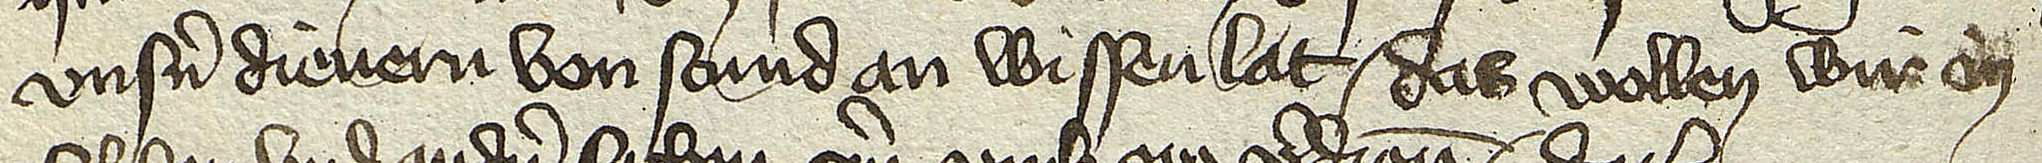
vnſn* dienern von ſtund an wiſſen lat / das wollen wir an
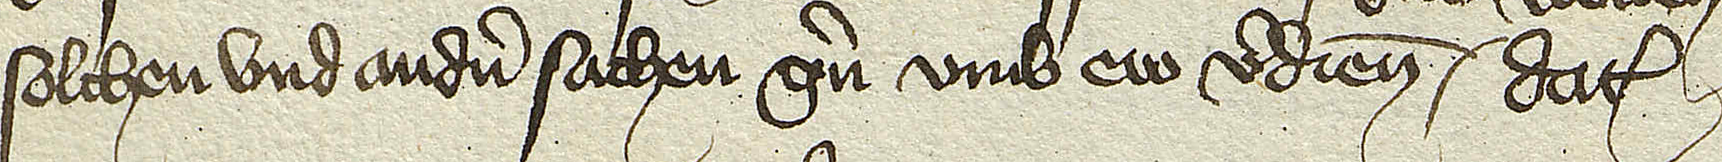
ſolchen vnd andn* ſachen g*n vmb ew v*dien* / dat*
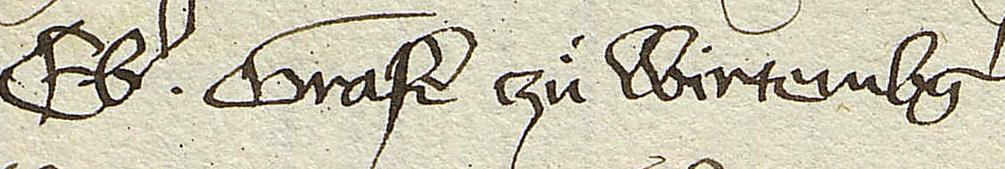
Eb*. Grafe* cʒü Wirtemb*g
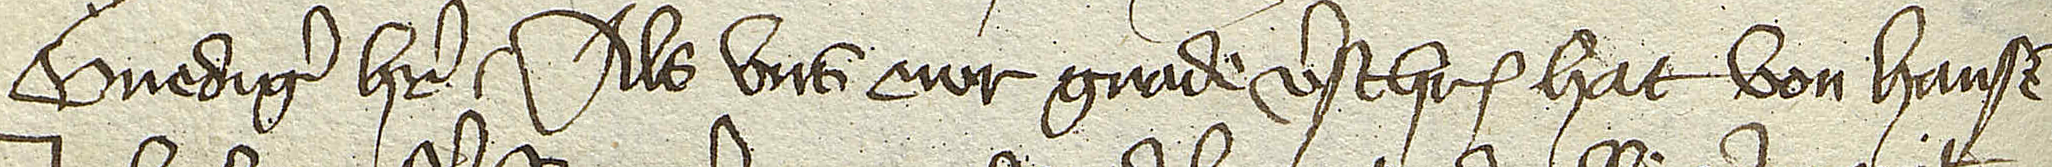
Gnedig* hr* / Als vns ewr gnade v*ſchr* hat von hanſe*
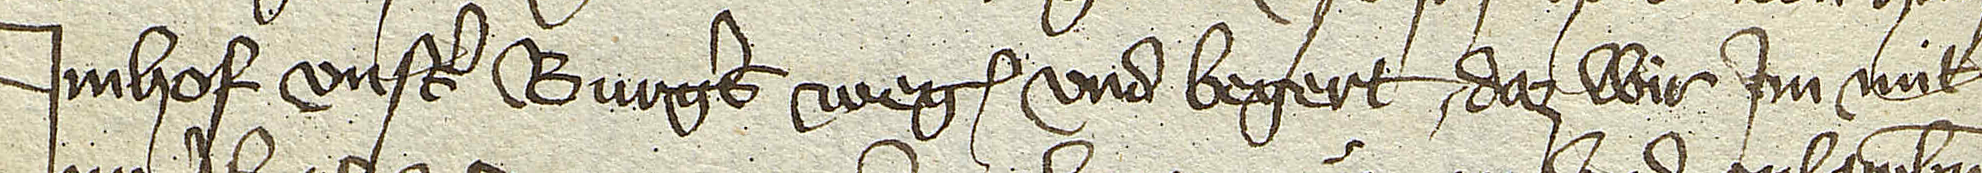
Imhof vnſs* Burg*s weg* vnd begert / daʒ wir Im mit
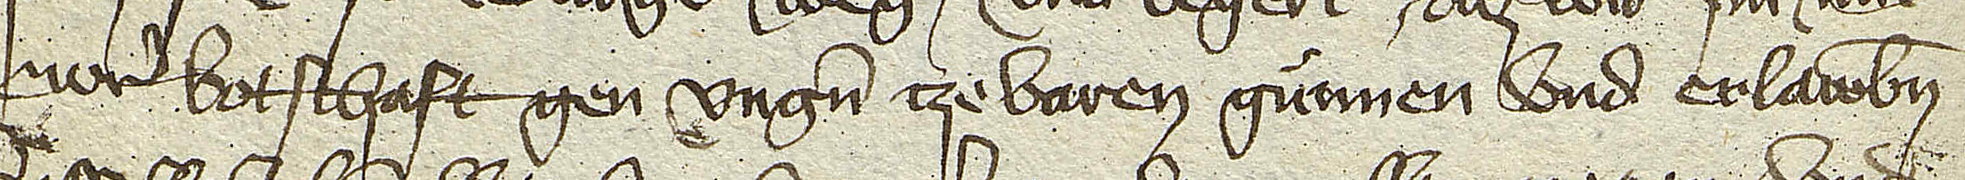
ewr* botſchaft gen vngn* cʒe varen günnen vnd erlawbn*
